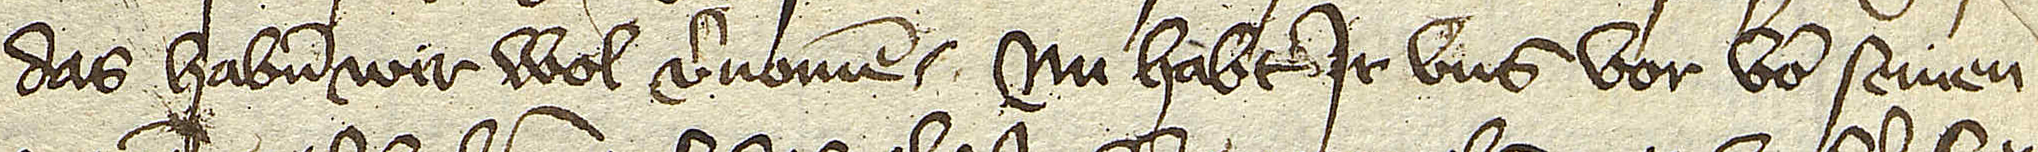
das habn* wir wol v*nome* / Nu habt Ir vns vor vo* ſeinen
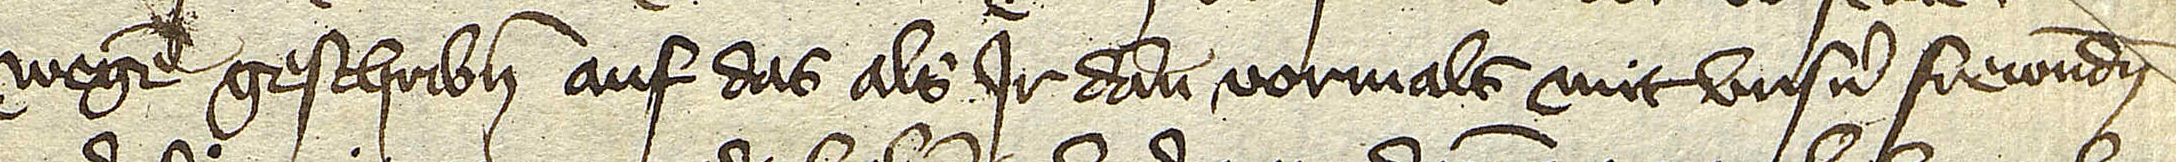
wege* geſchribn* auf das als Ir dan* vormals mit vnſn* frewndn*
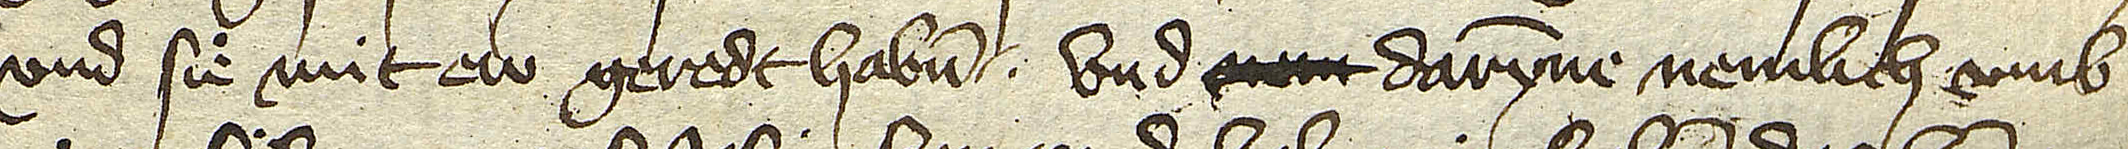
vnd ſie mit ew geredt habn* / . vnd nem daryne* nemlich vmb
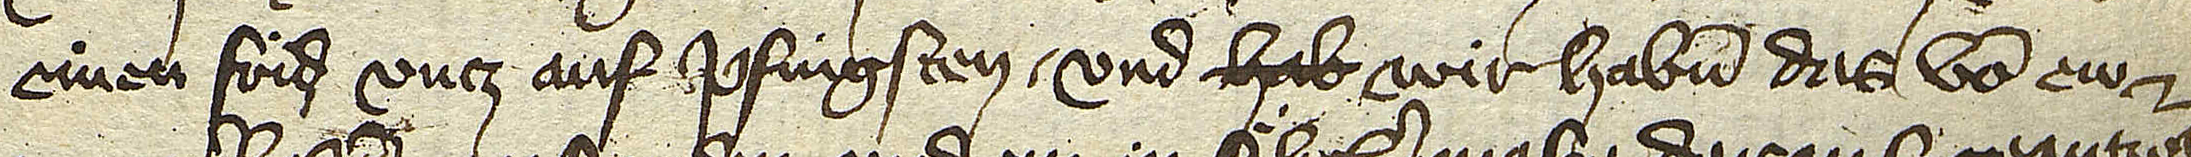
einen frid vncʒ auf Pfingſten / vnd hab wir habn* das vo* ew
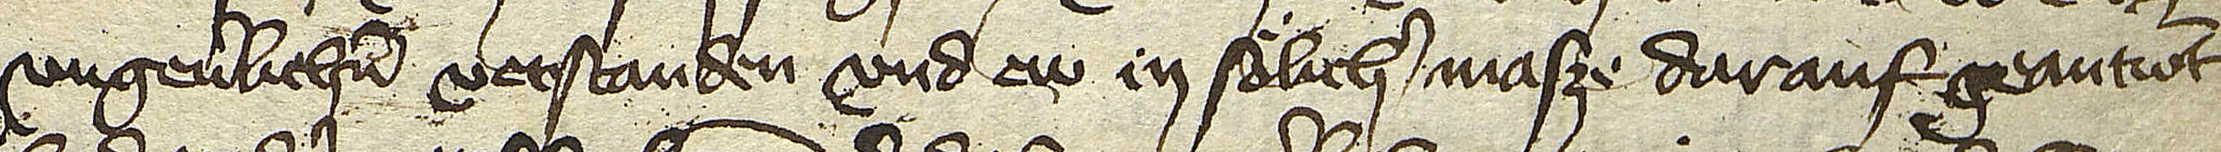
vngeu*lichn* verſtanden vnd ew in ſölich* maſʒe darauf geantwt*
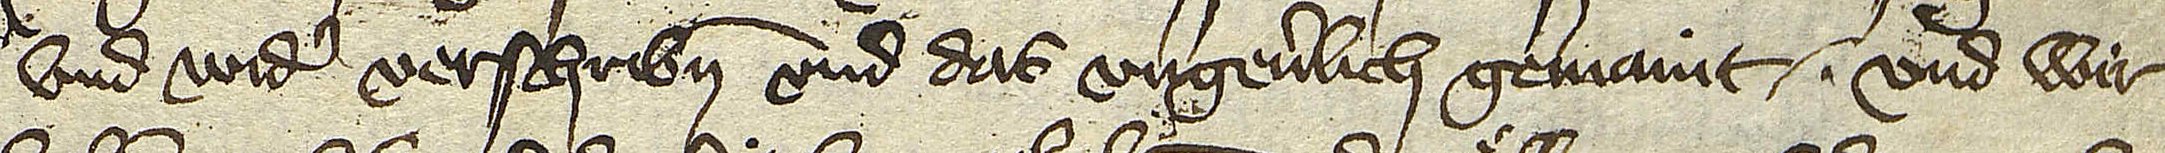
vnd wid* verſchribn* vnd das vngeu*lich gemaint / . vnd wir
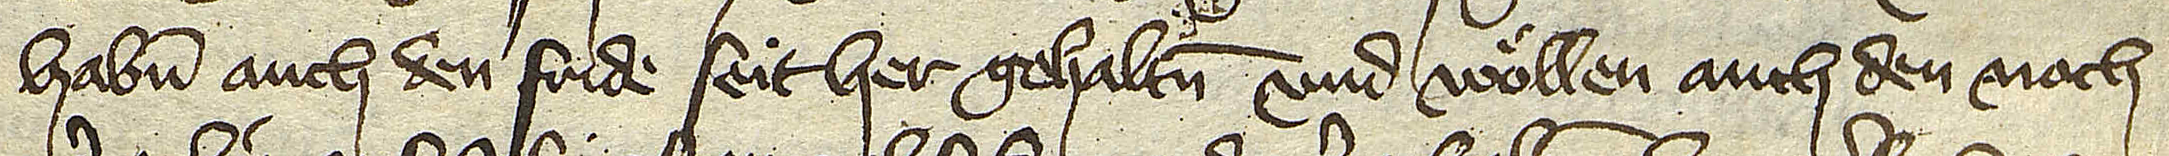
habn* auch den fride ſeit her gehaltn* vnd wöllen auch den noch
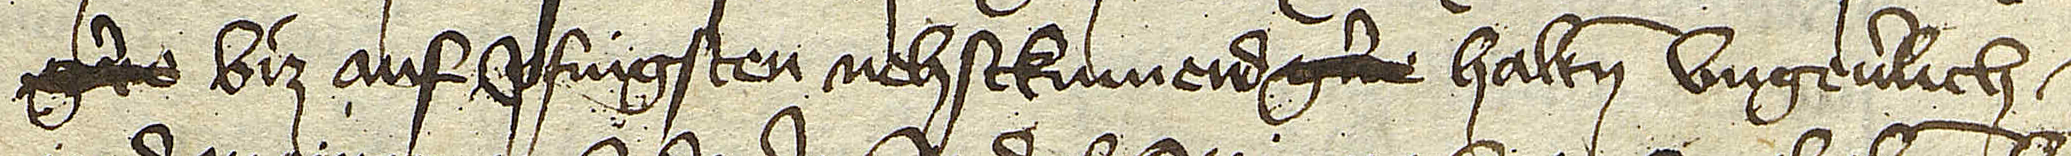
g*ne biʒ auf pfingſten nehſtkumend g*ne haltn* vngeu*lich /
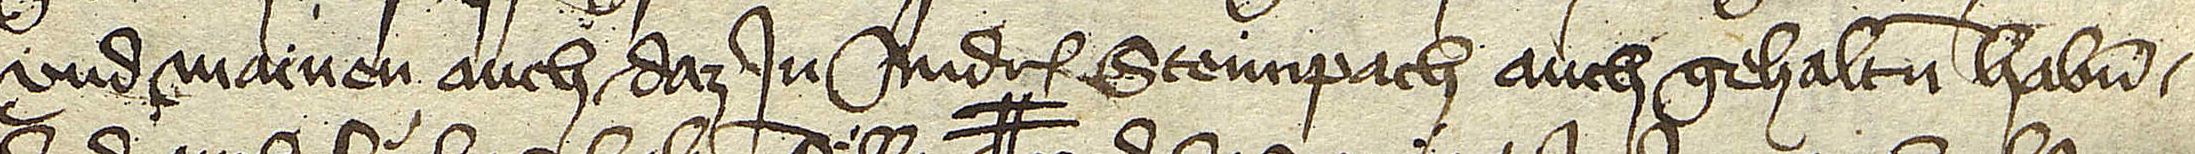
vnd mainen auch / daʒ In Andr* Steimpach auch gehaltn* habn* /
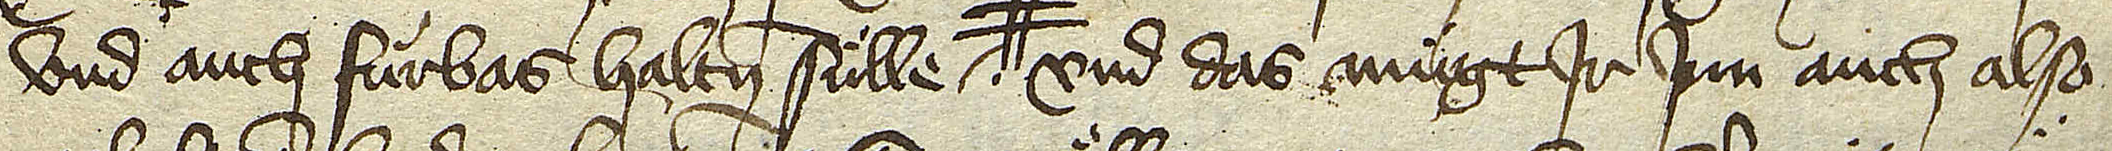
vnd auch fürbas haltn* ſülle / . vnd das mügt Ir Im auch alſo
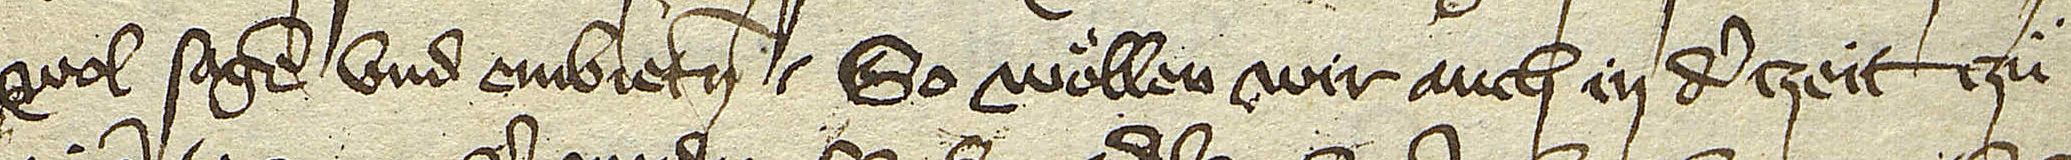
wol ſage* vnd embietn* / So wöllen wir auch in d* cʒeit cʒü
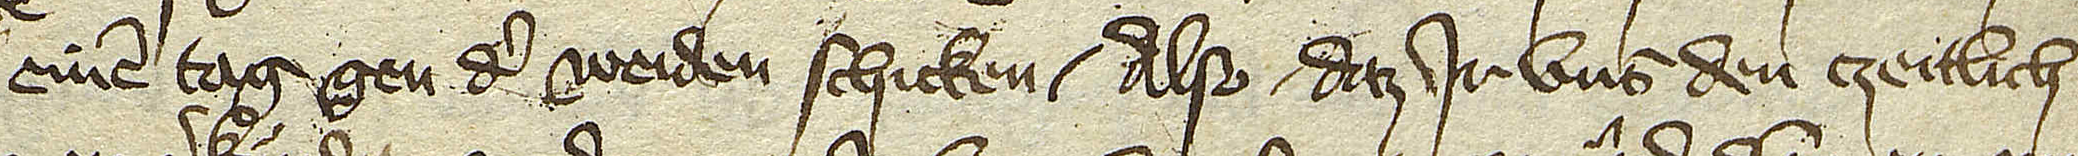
eine* tag gen d* weiden ſchicken / Alſo / daʒ Ir vnd den cʒeitlich
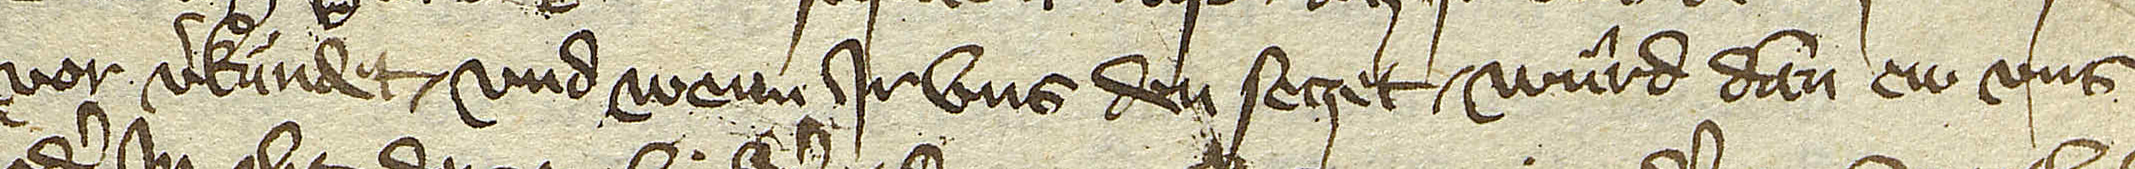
vor v*kündet / vnd wenn Ir vns ſecʒt / würd dan* ew vns
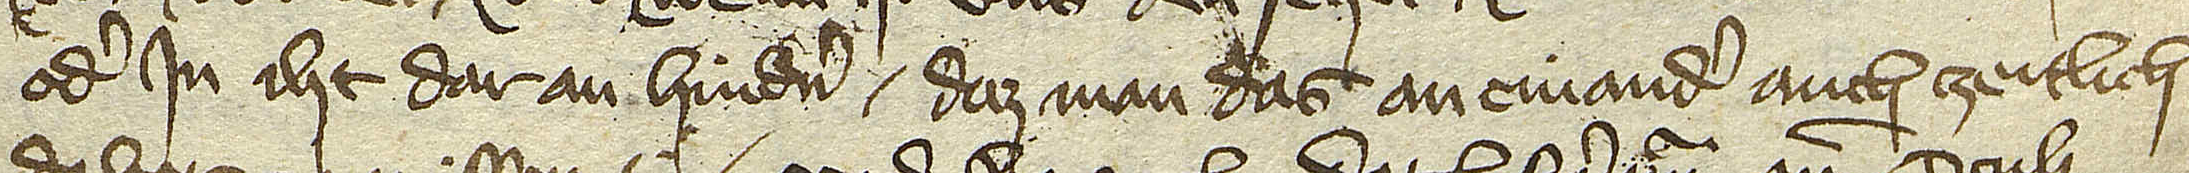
od* In iht dar an hindn* / daʒ man das an einand* auch cʒeitlich
